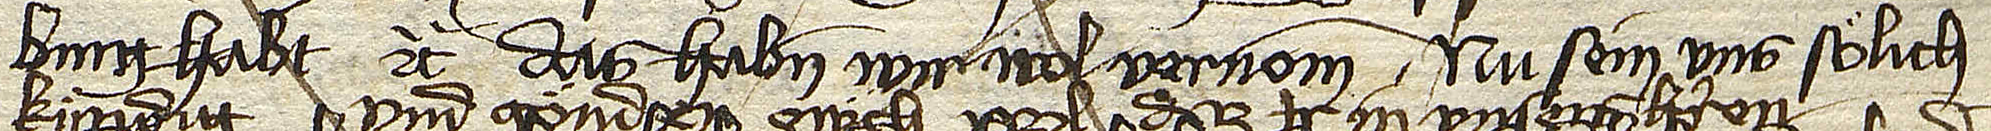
burg habt ec* Das habn* wir wol vernom* / Nu ſein vns ſölich
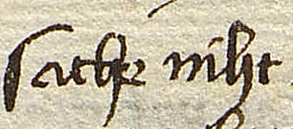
ſache niht
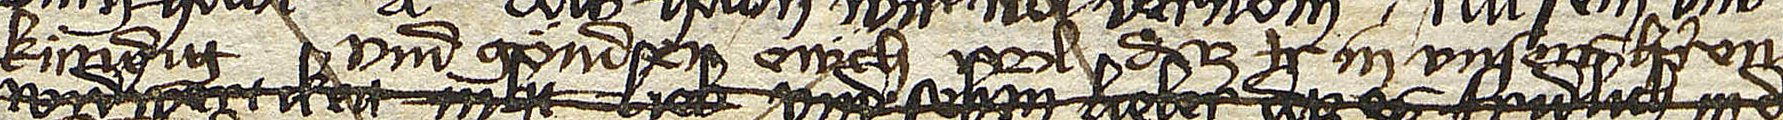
kündig vnd gönden eẅch wol daʒ Ir in vnſers h*ren
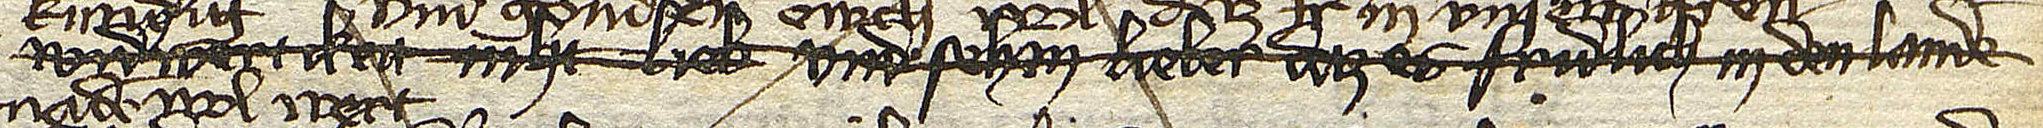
wid*wertkeit niht lieb vnd ſehm lieber daʒ es fridlich in den lande*
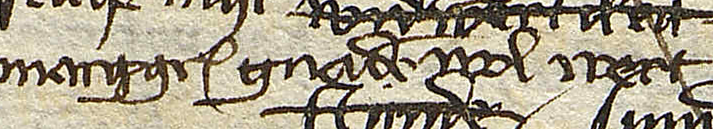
marggr* gnade* wol wert
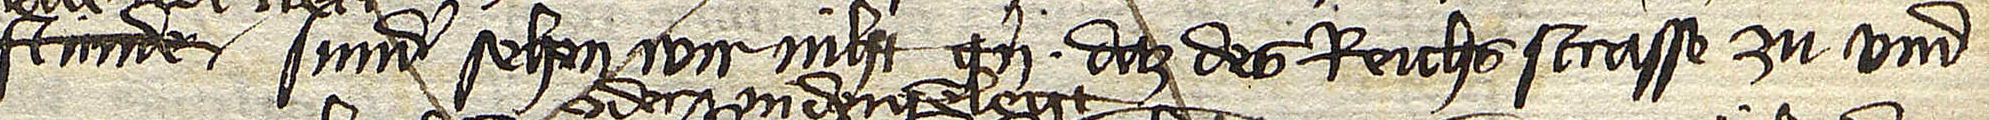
ſtünde / ſund* ſehen wir niht g*n . daʒ des Reichs ſtraſſe ʒu vnd
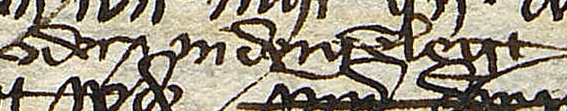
oder nidergelegt
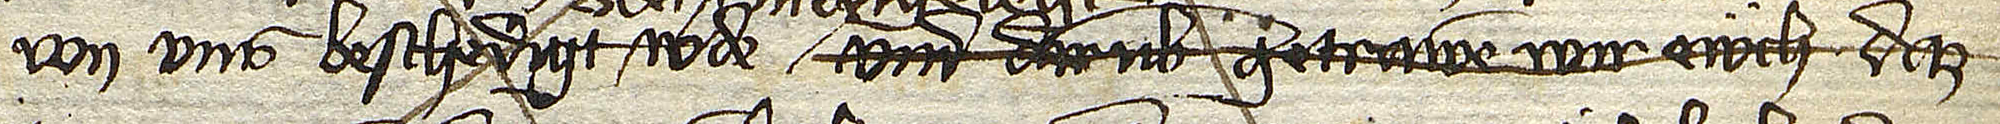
von vns beſchedigt w*de / vnd darub* getrawe* wir eẅch daʒ
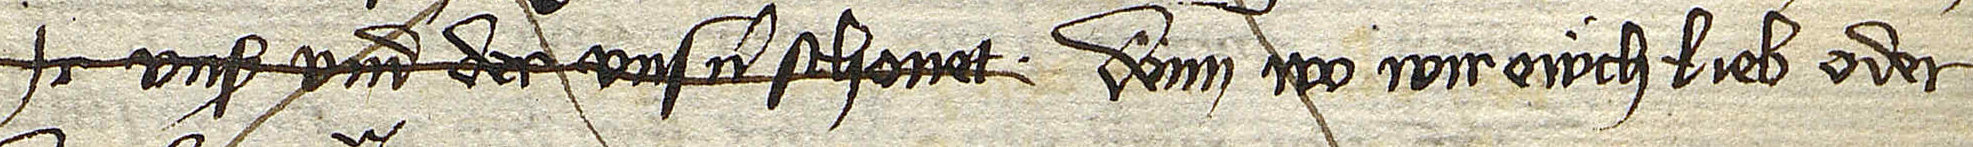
Ir vnſ* vnd der vnſn* ſchonet . Denn wo wir eẅch lieb oder
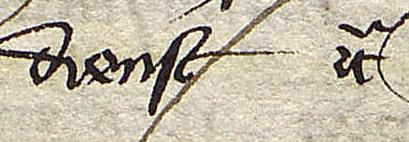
dienſt ec*
